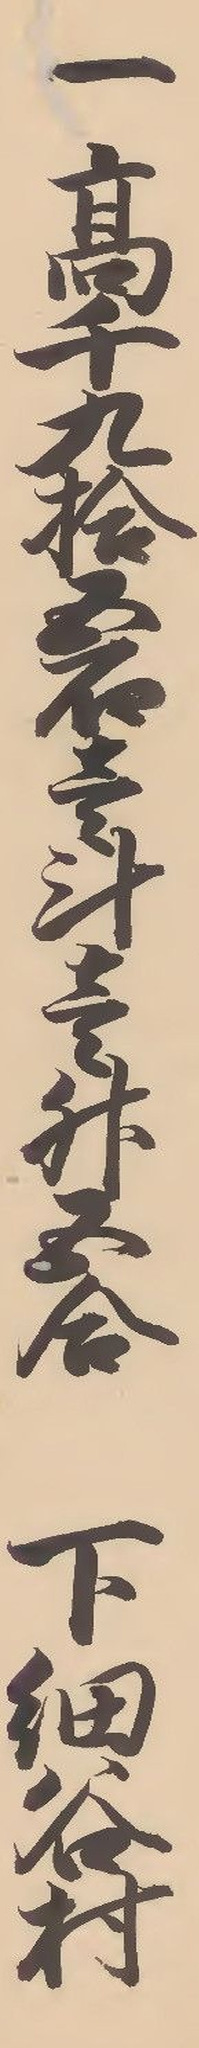一高千九拾五石壱斗壱升五合下細谷村

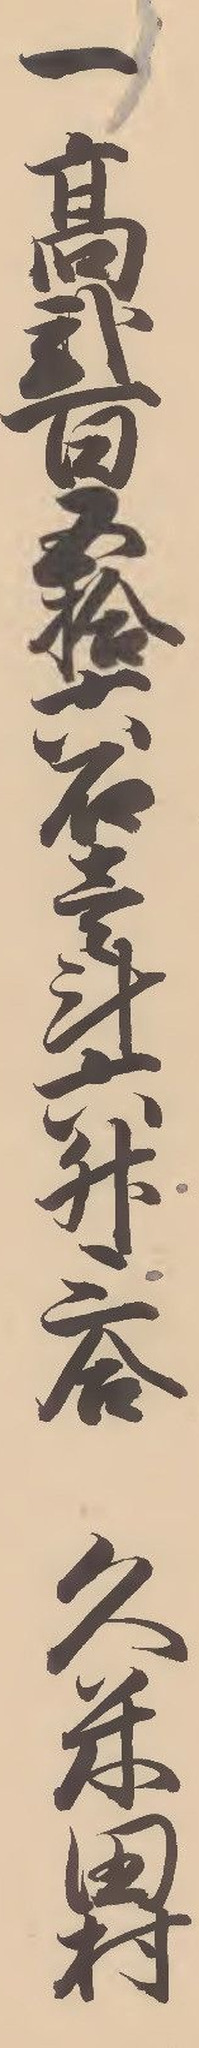一高弐百五拾六石壱斗六升三合久米田村
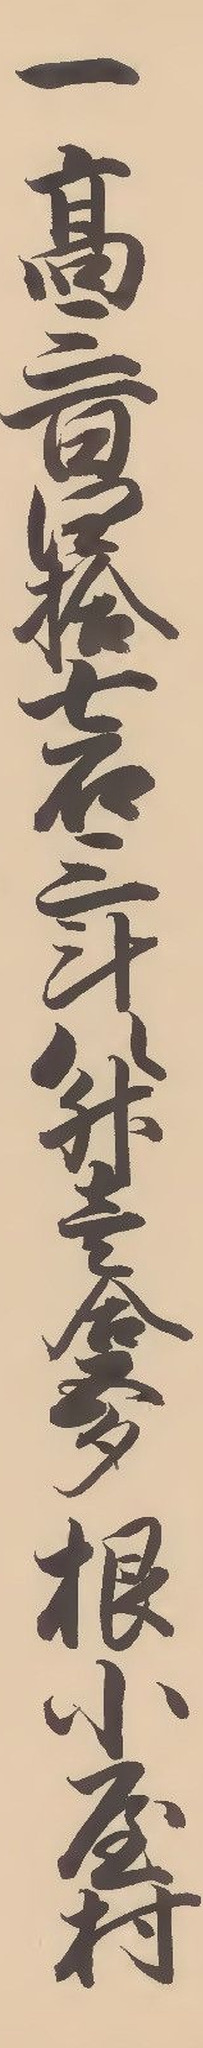一高三百四拾七石三斗八升壱合五勺根小屋村
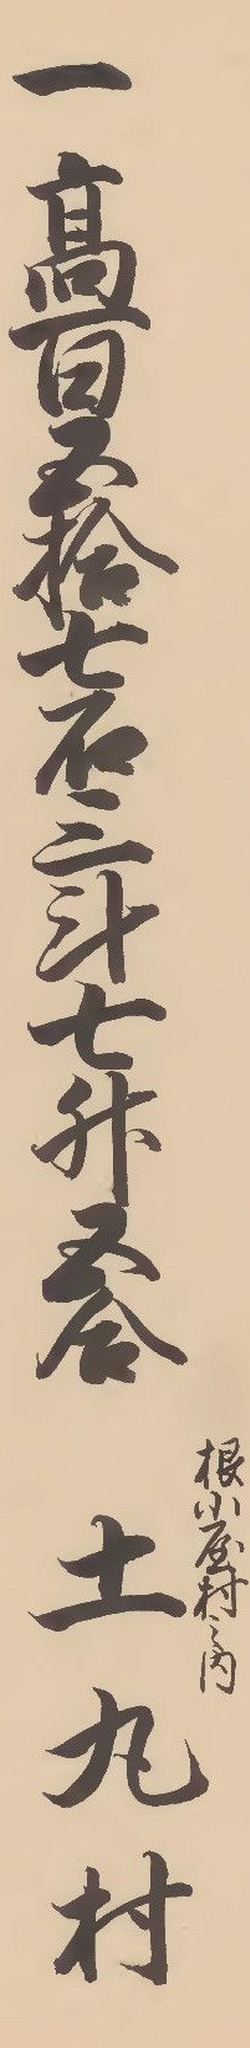一高百五拾七石三斗七升五合土丸村
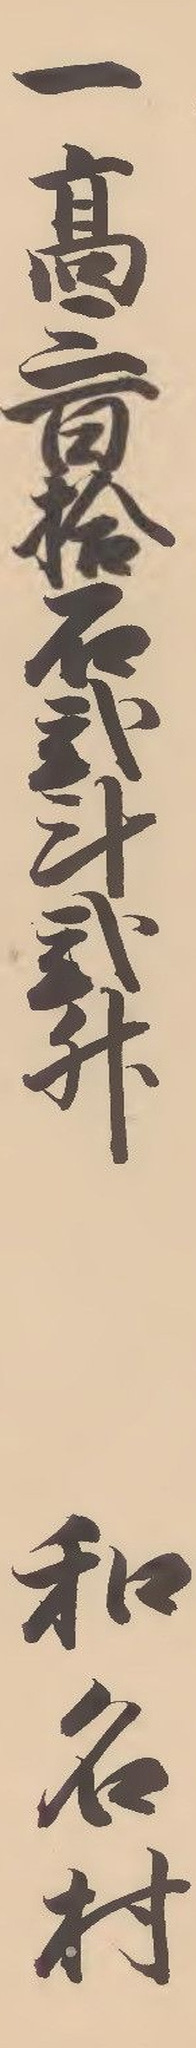一高三百拾石弐斗弐升和名村
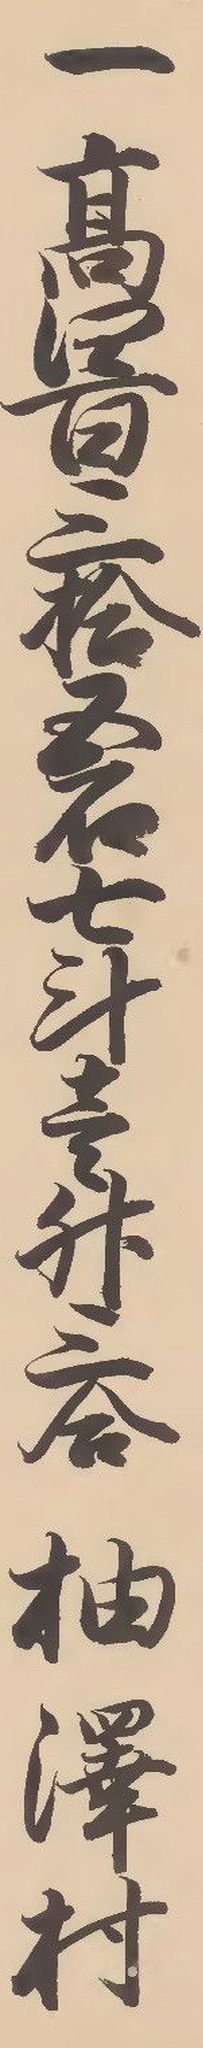一高四百三拾五石七斗壱升三合柚澤村
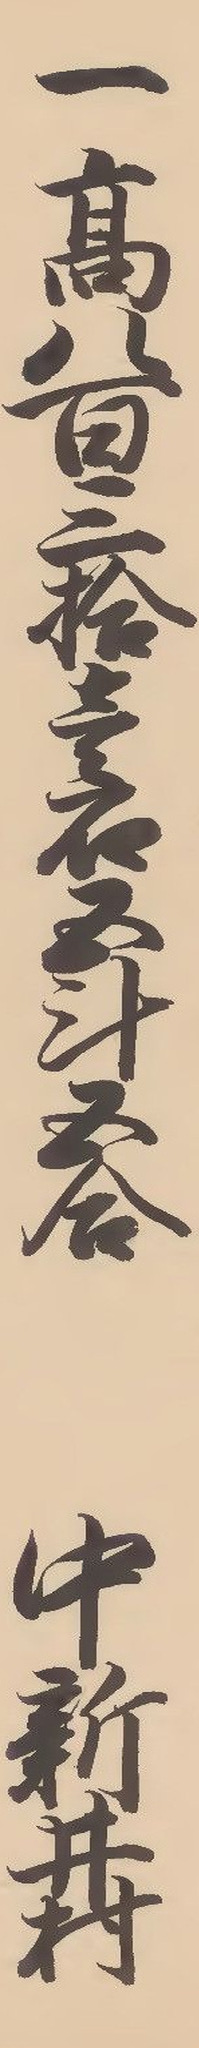一高八百三拾壱石五斗五合中新井村
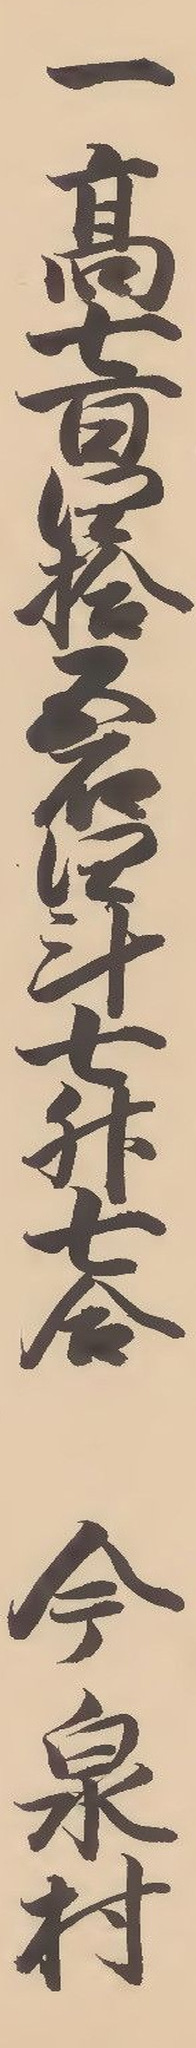一高七百四拾五石四斗七升七合今泉村
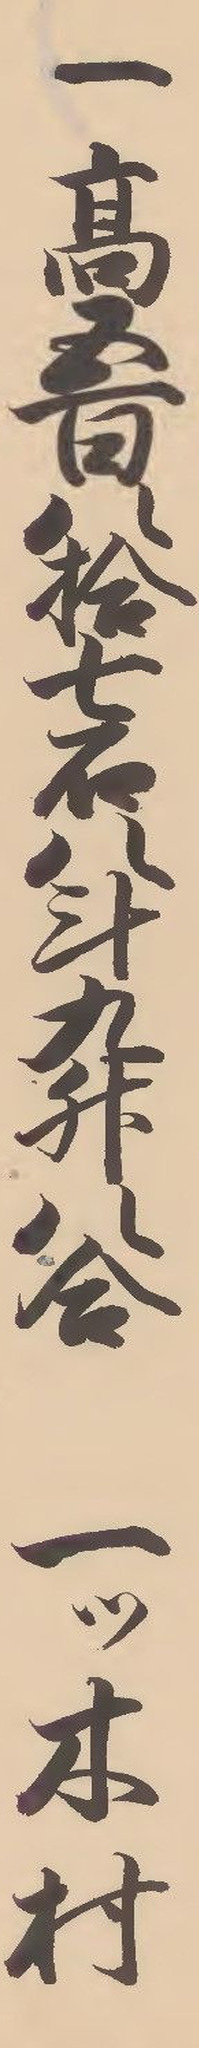一高五百八拾七石八斗九升八合一ッ木村

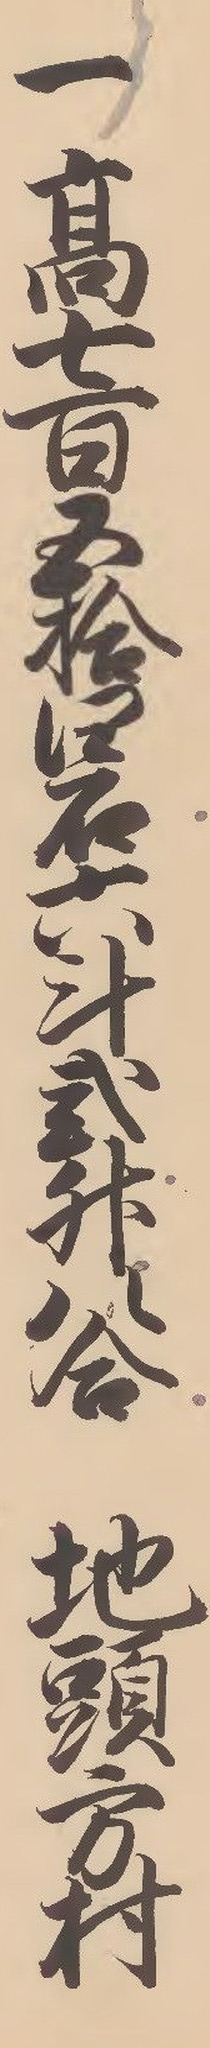一高七百五拾四石六斗弐升八合地頭方村
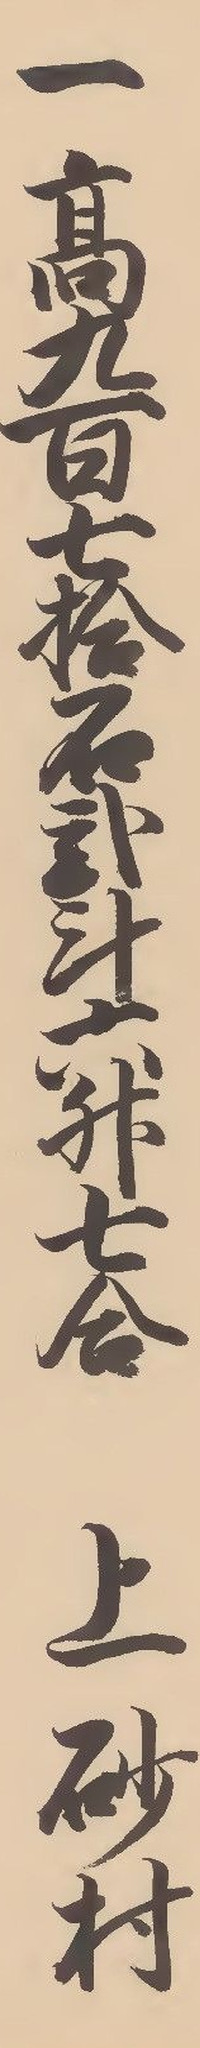一高九百七拾石弐斗六升七合上砂村
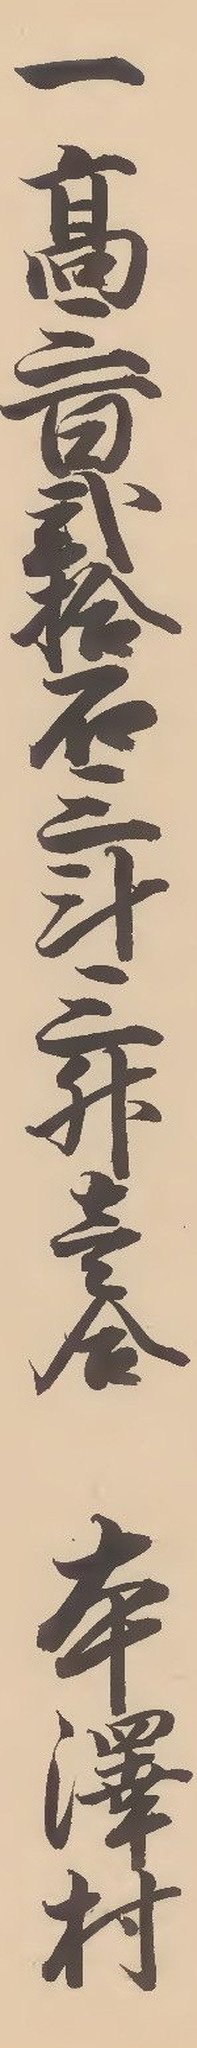一高三百弐拾石三斗三升壱合本澤村
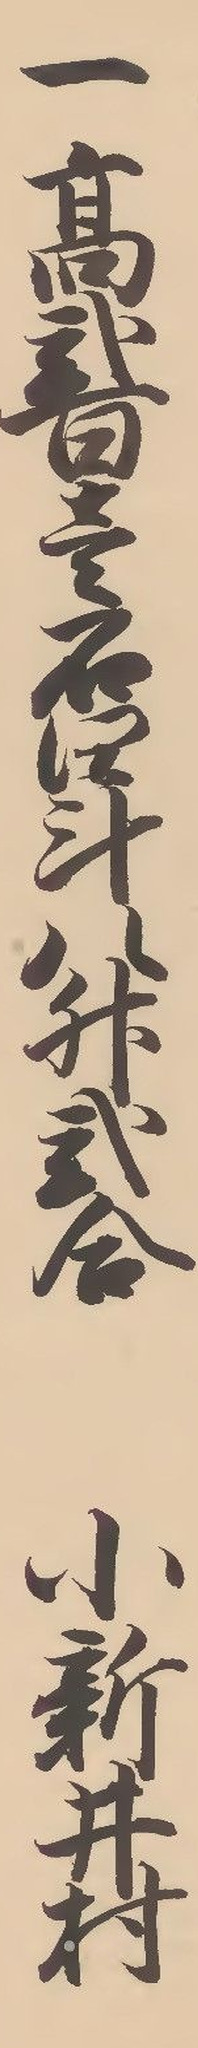一高弐百壱石四斗八升弐合小新井村
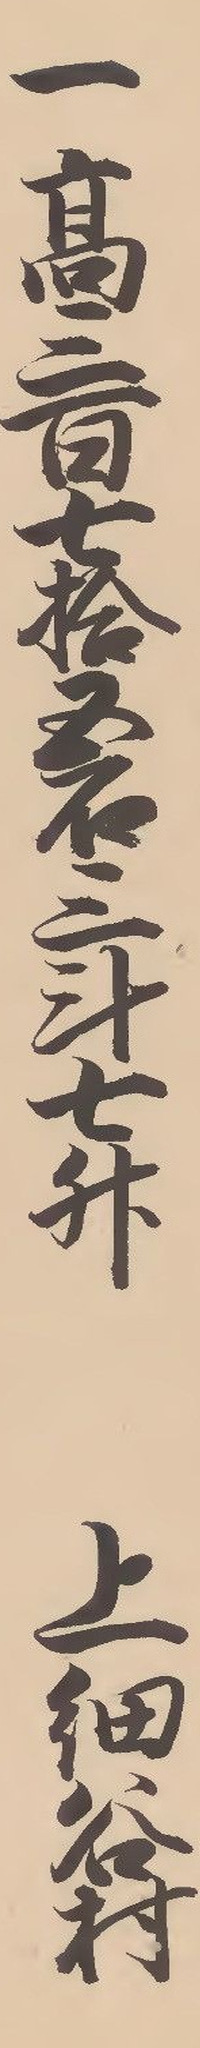一高三百七拾五石三斗七升上細谷村
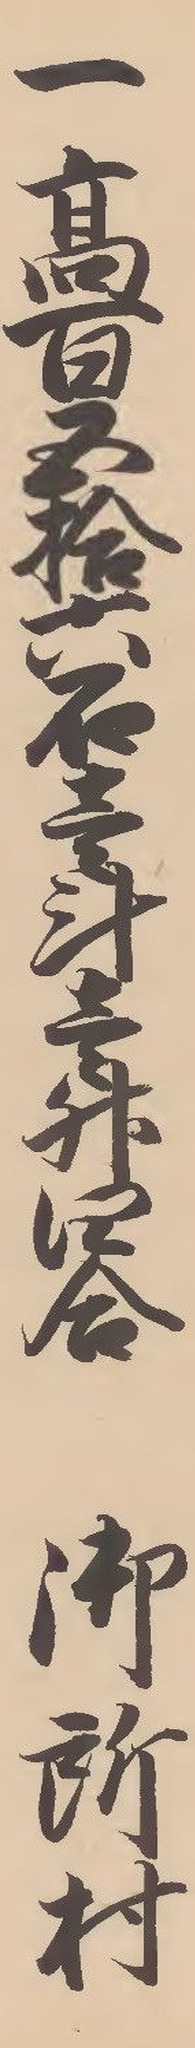一高百五拾六石壱斗壱升四合御所村
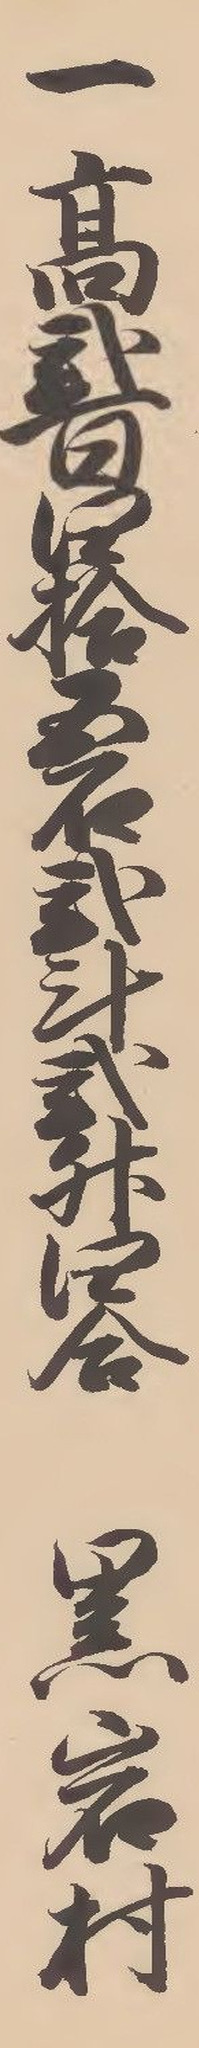一高弐百四拾五石弐斗弐升四合黒岩村
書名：武蔵国郷帳　下
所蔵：国立公文書館 National Archives of Japan
